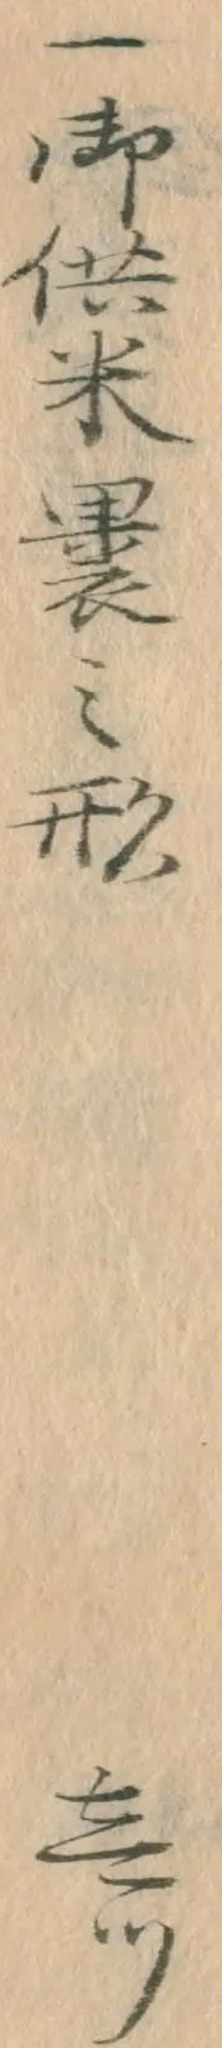一御供米褁之形壱ツ
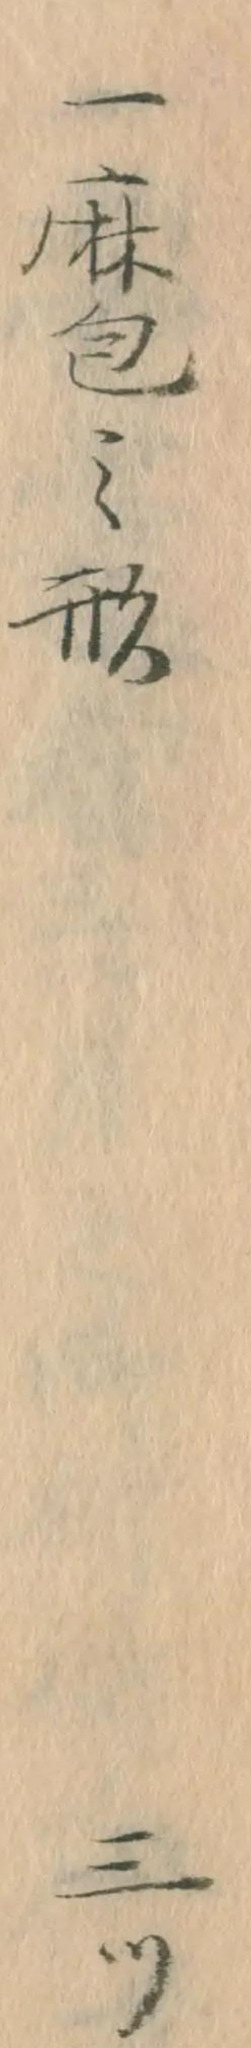一麻包之形三ツ

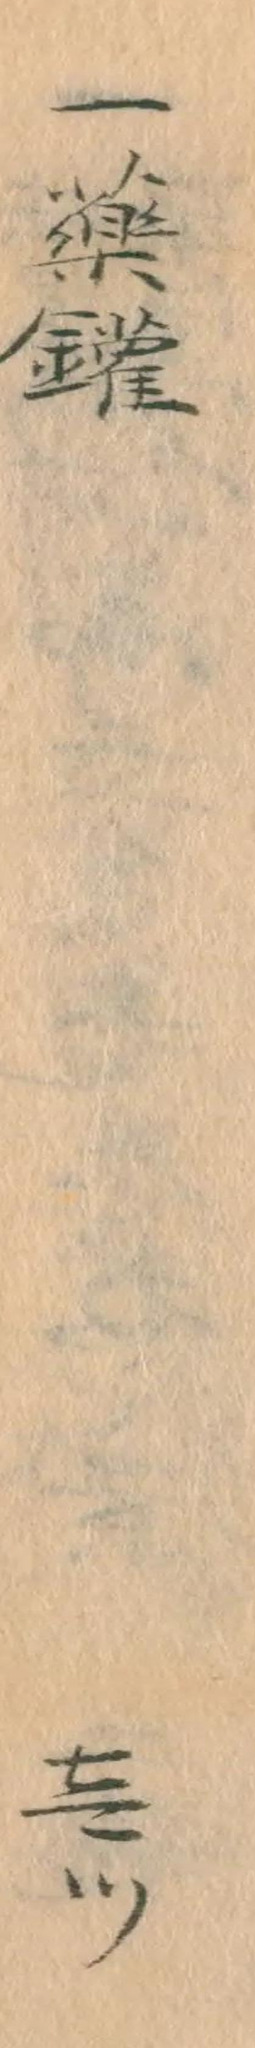一薬鑵壱ツ
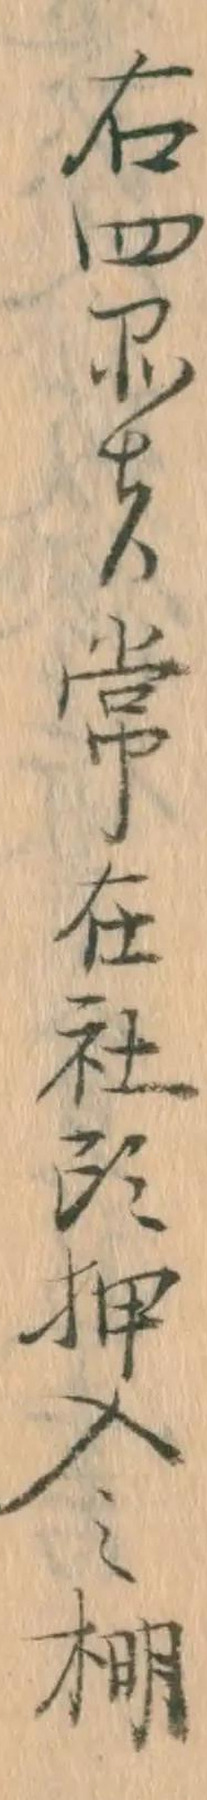右四品者常在社頭押入之棚
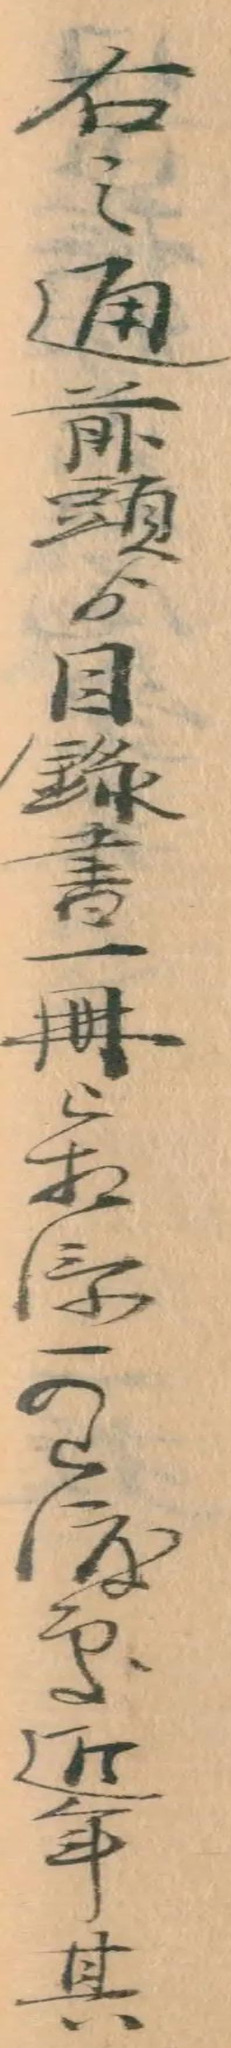右之通前頭ゟ目録書一冊被相添可被渡處近年其
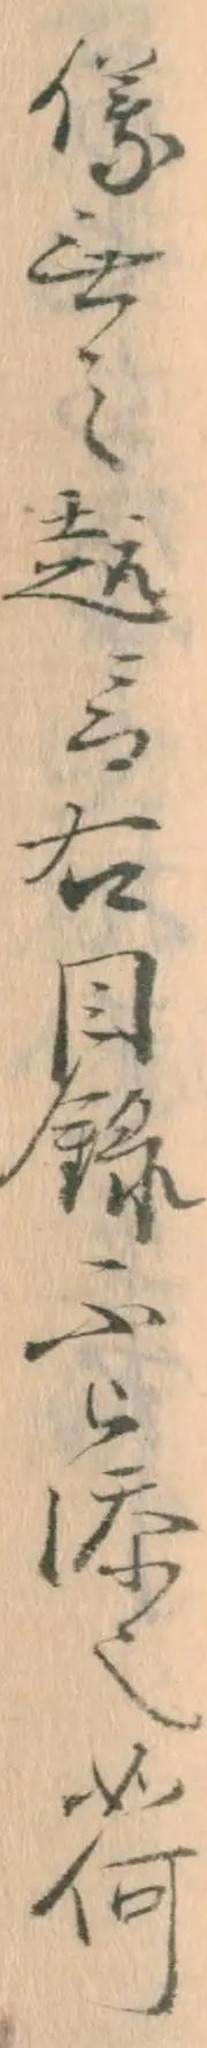儀無之趣ニ而右目録不被添也如何
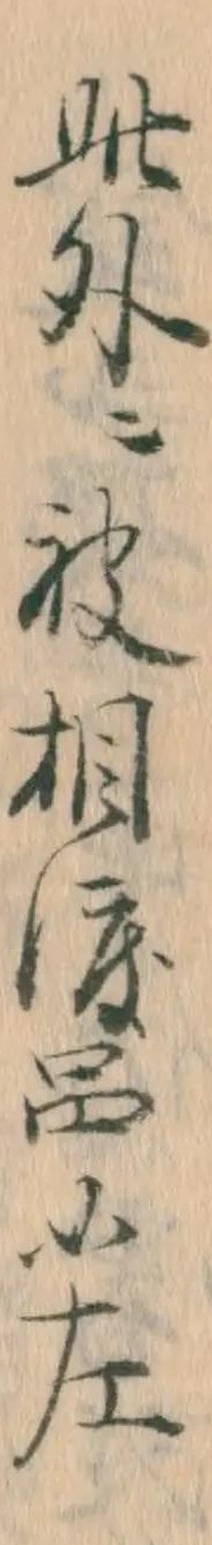此外ニ被相渡品以左
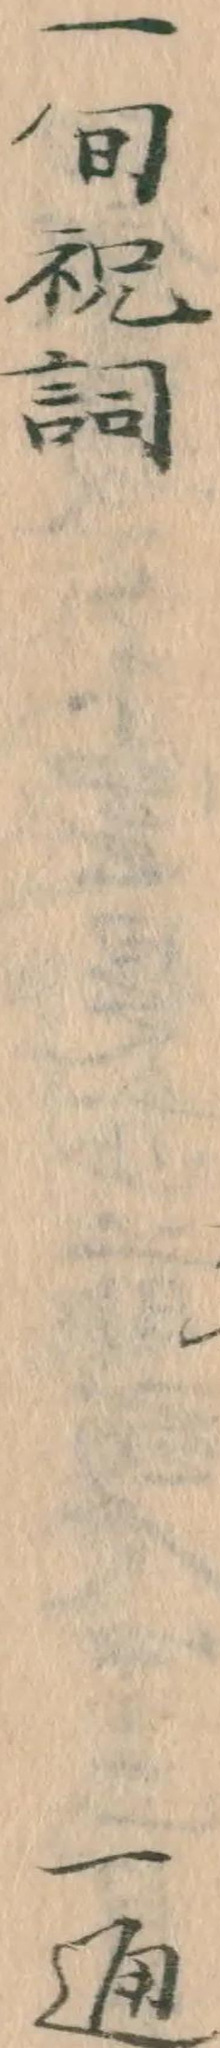一旬祝詞一通
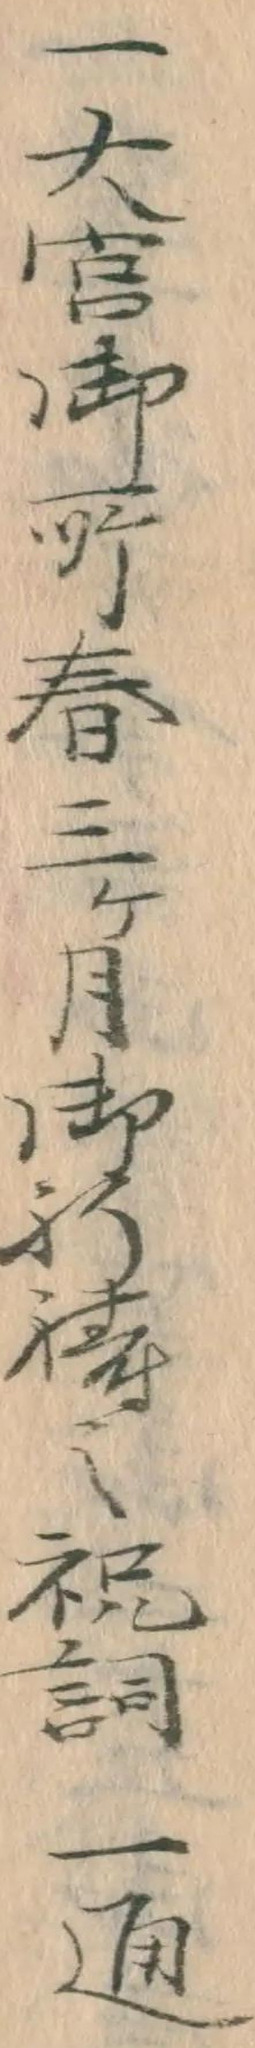一大宮御所春三ケ月御祈祷之祝詞一通
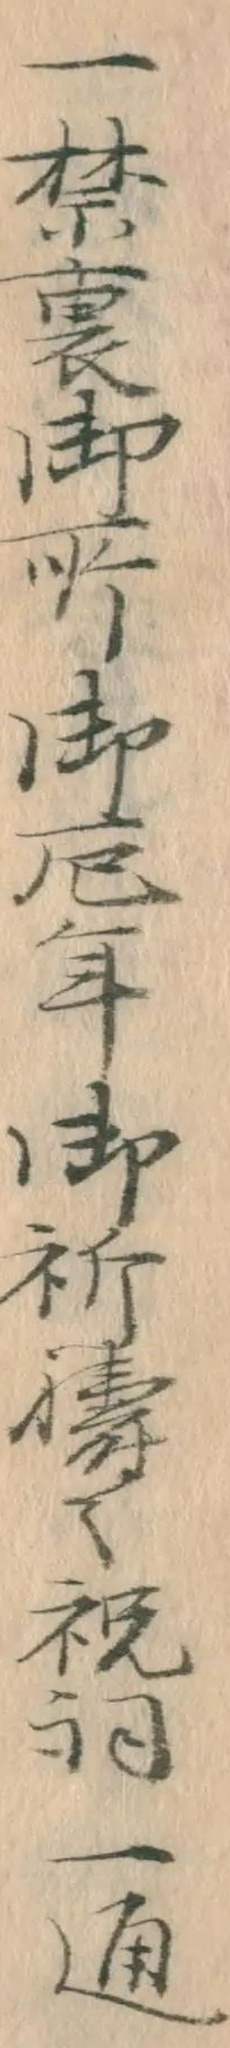一禁裏御所御厄年御祈祷之祝詞一通
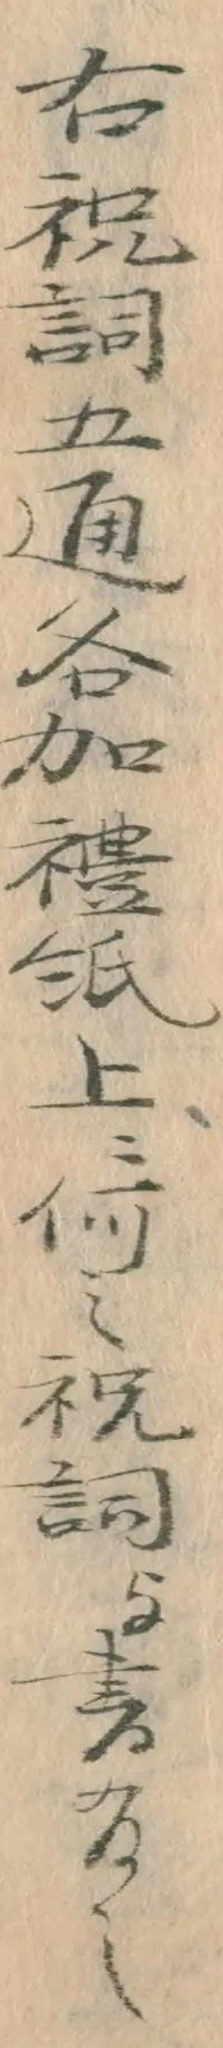右祝詞五通各加禮紙上ニ何之祝詞と書有之
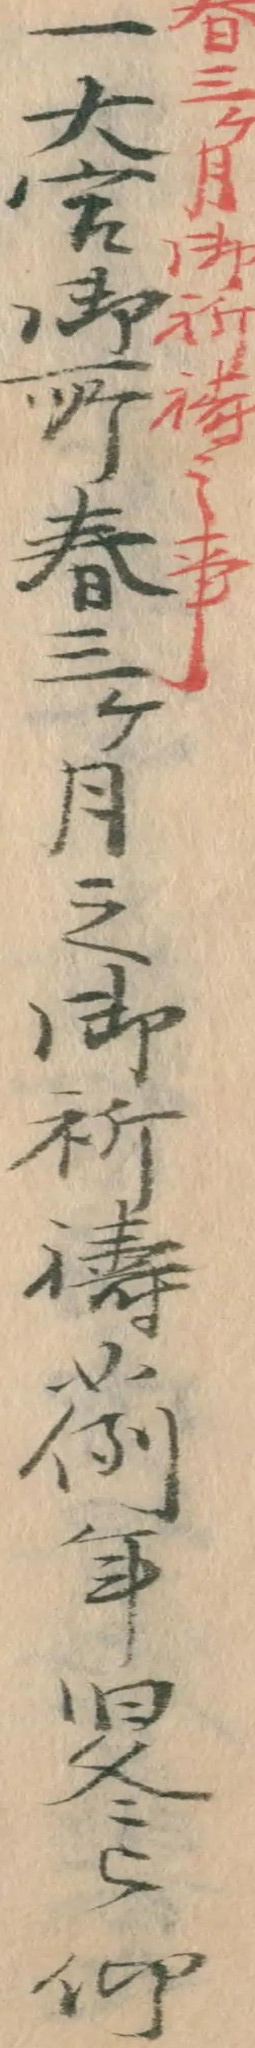一大宮御所春三ヶ月之御祈祷如例年旧冬被仰

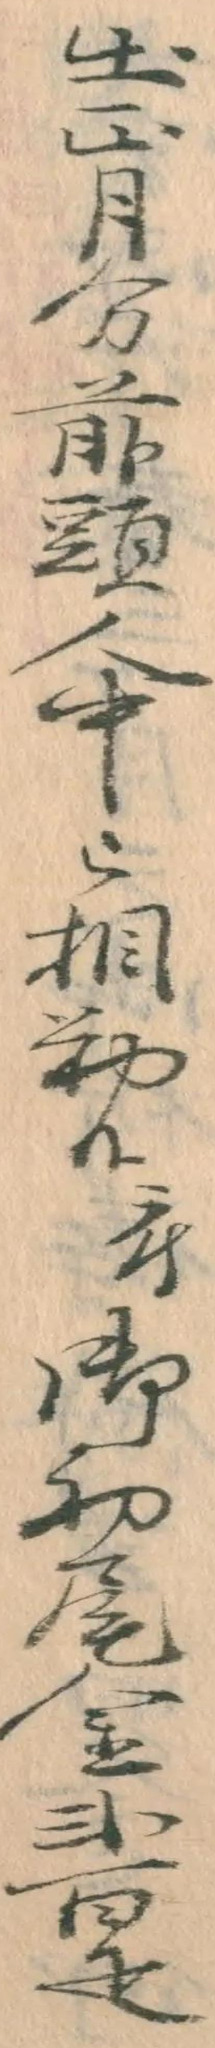出正月分前頭人中被相勤候ニ付御初尾金弐百疋
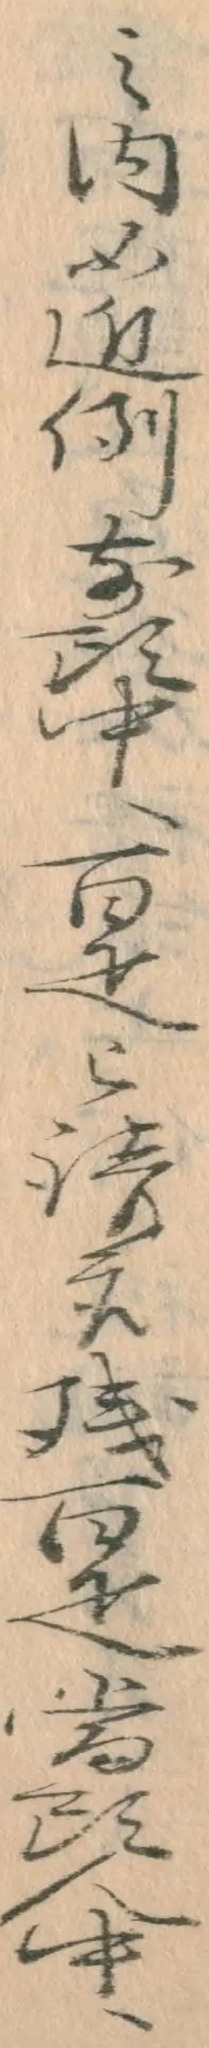之内如近例前頭中へ百疋被請取残百疋當頭人中へ
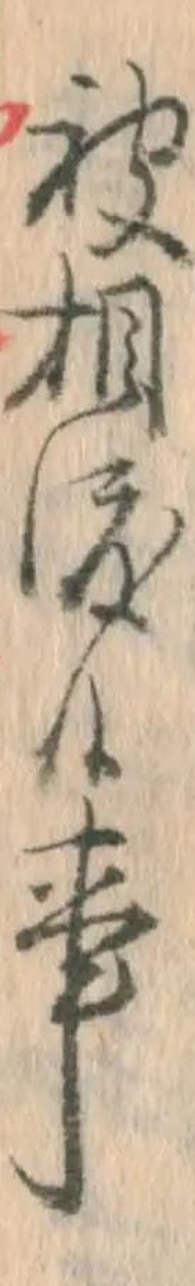被相渡候事
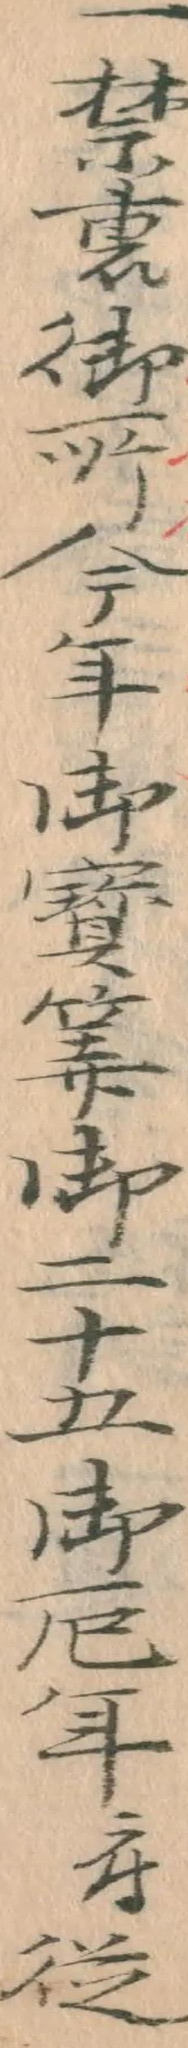一禁裏御所今年御寶算御二十五御厄年ニ付従
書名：賀茂社記録. 第72冊
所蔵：国立国会図書館 National Diet Library, JAPAN
